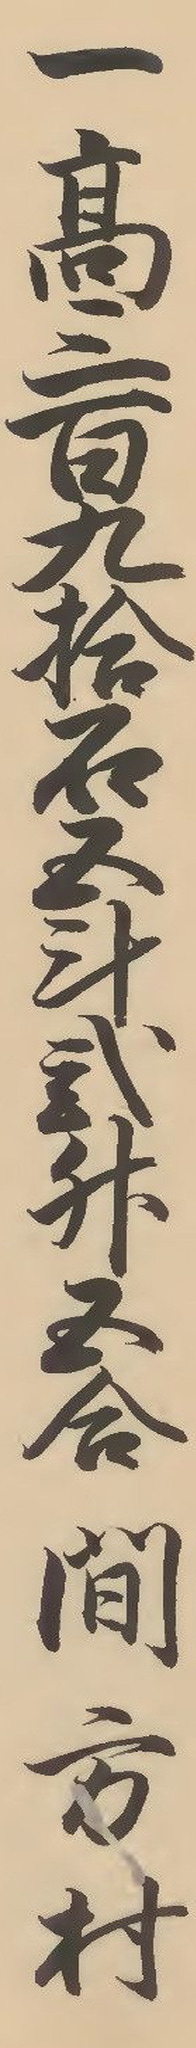一髙三百九拾石五斗弐升五合間方村
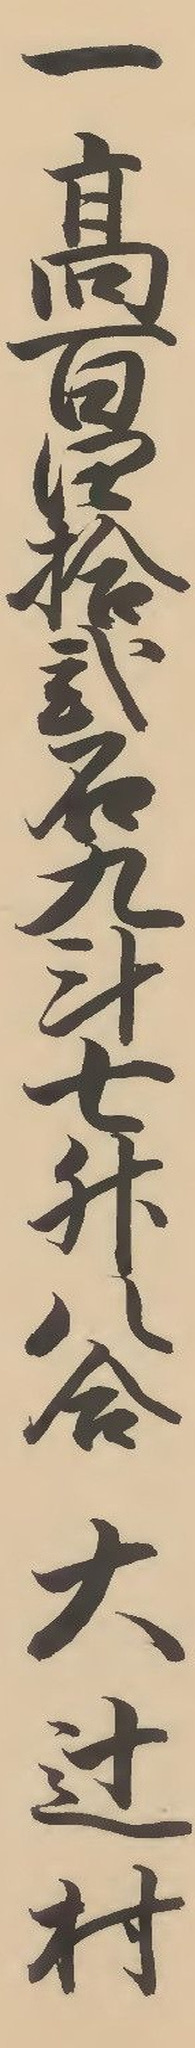一髙百四拾弐石九斗七升八合大辻村
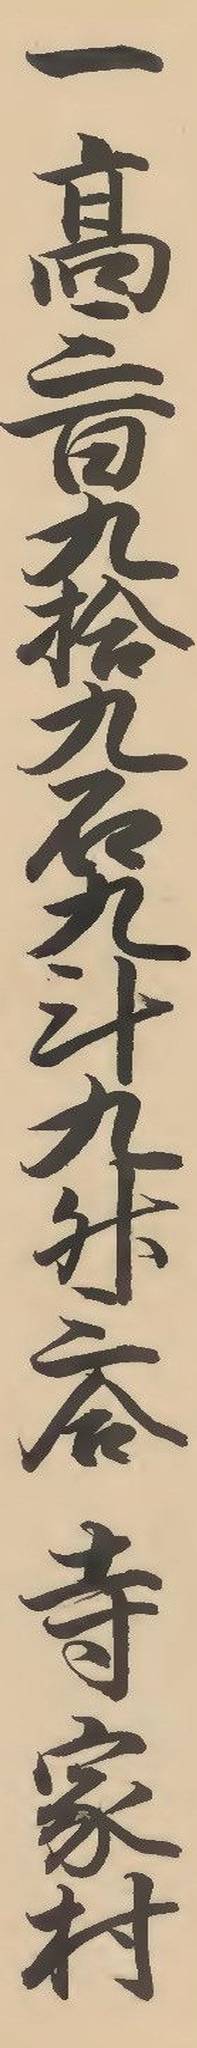一髙三百九拾九石九斗九升三合寺家村
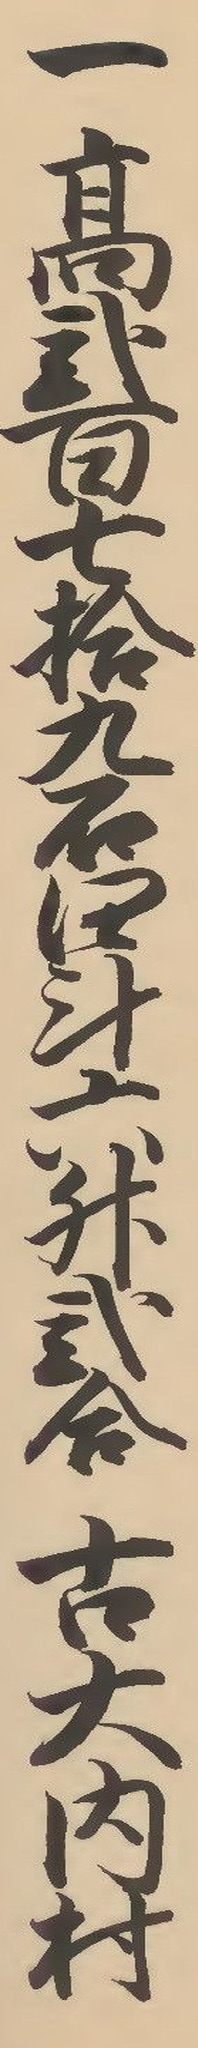一髙弐百七拾九石四斗六升弐合古大内村
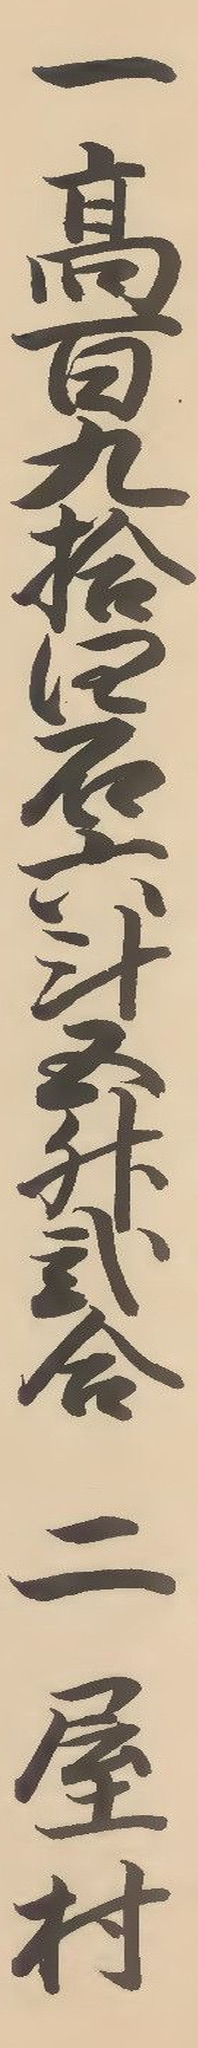一髙百九拾四石六斗五升弐合二屋村
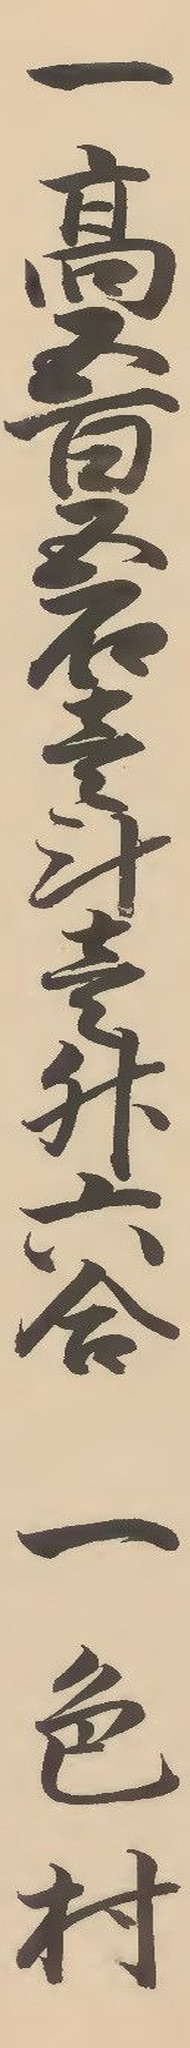一髙五百五石壱斗壱升六合一色村
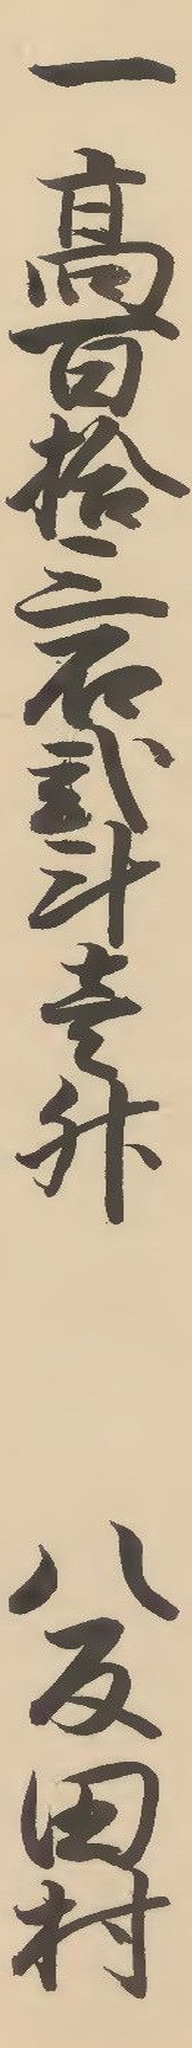一髙百拾三石弐斗壱升八反田村
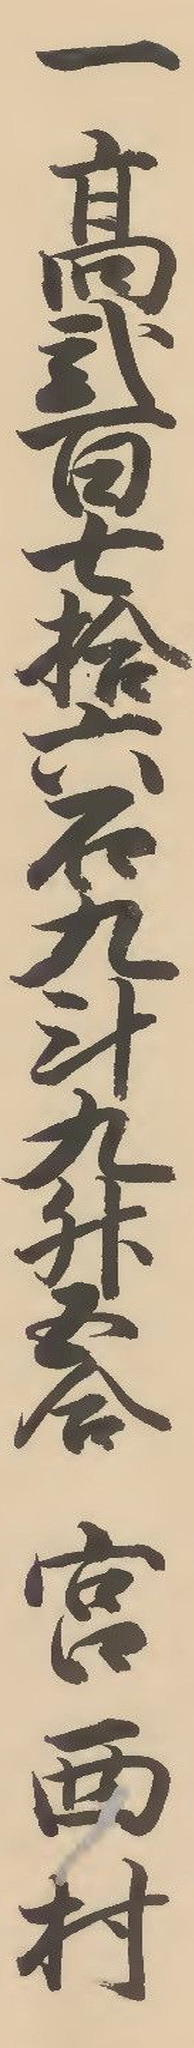一髙弐百七拾六石九斗九升五合宮西村

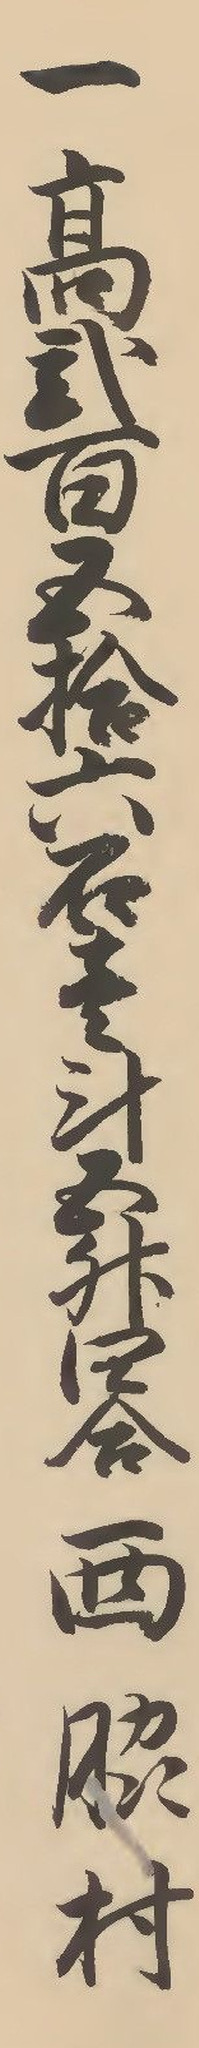一髙弐百五拾六石壱斗五升四合西脇村
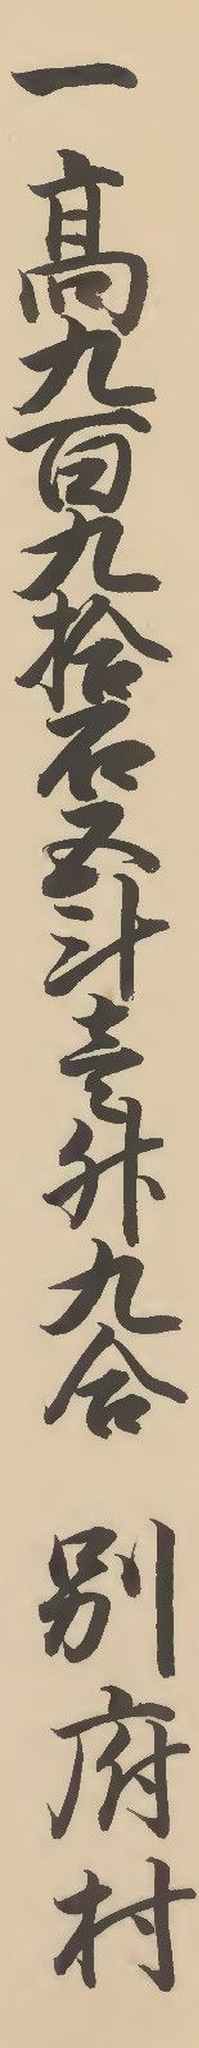一髙九百九拾石五斗壱升九合別府村
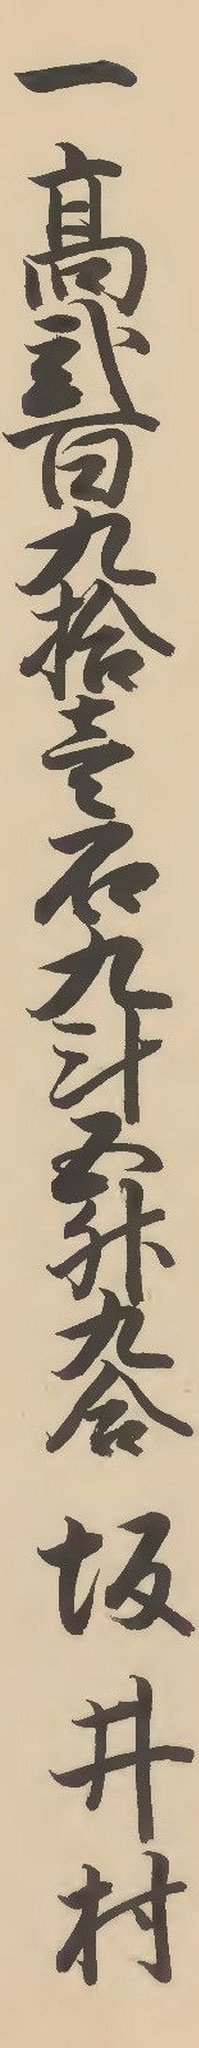一髙弐百九拾壱石九斗五升九合坂井村
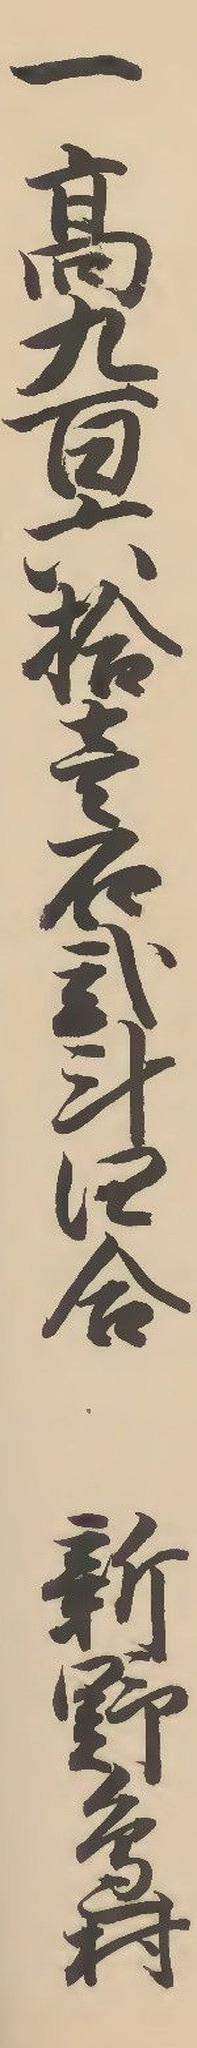一髙九百六拾壱石弐斗四合新野辺村
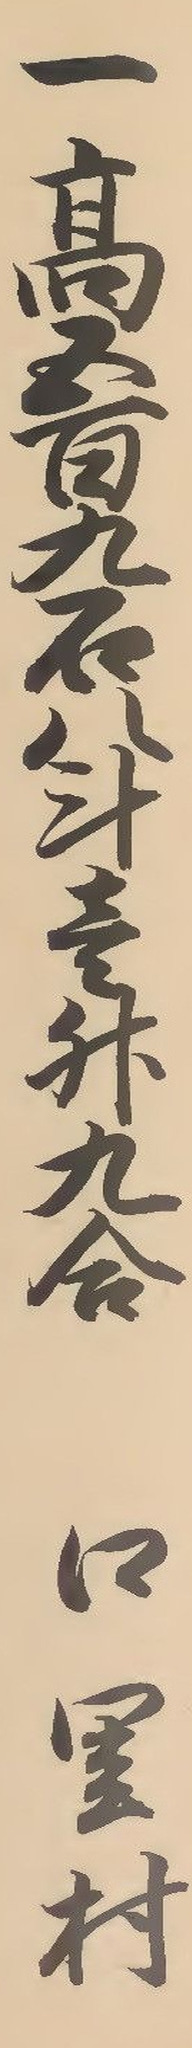一髙五百九石八斗壱升九合口里村
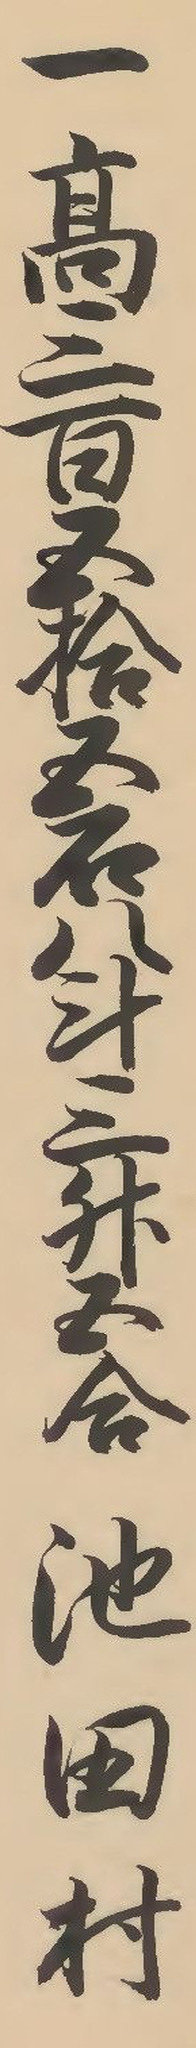一髙三百五拾五石八斗三斗五升池田村
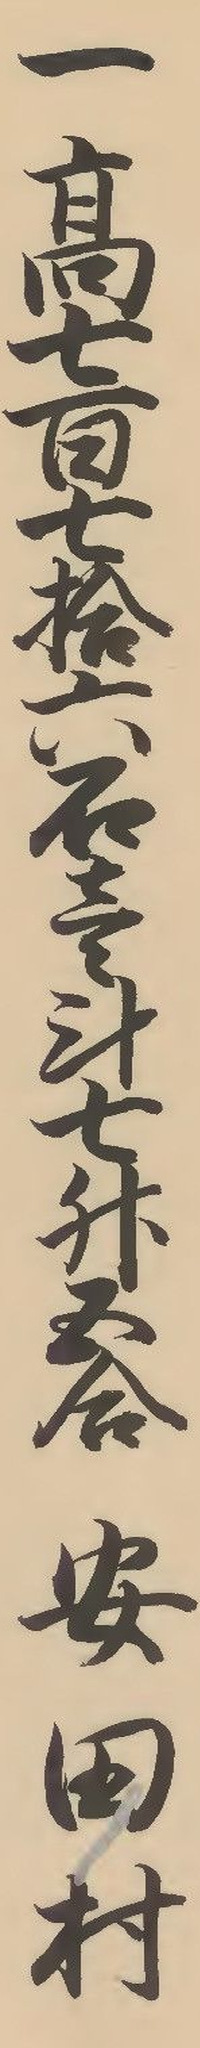一髙七百七拾六石壱斗七升五合安田村

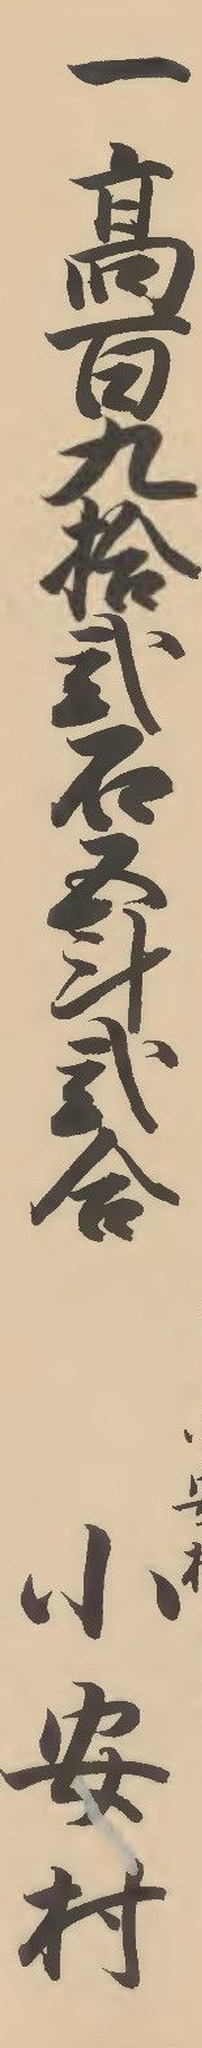一髙百九拾弐石五斗弐合小安村
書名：播磨国郷帳
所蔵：国立公文書館 National Archives of Japan
